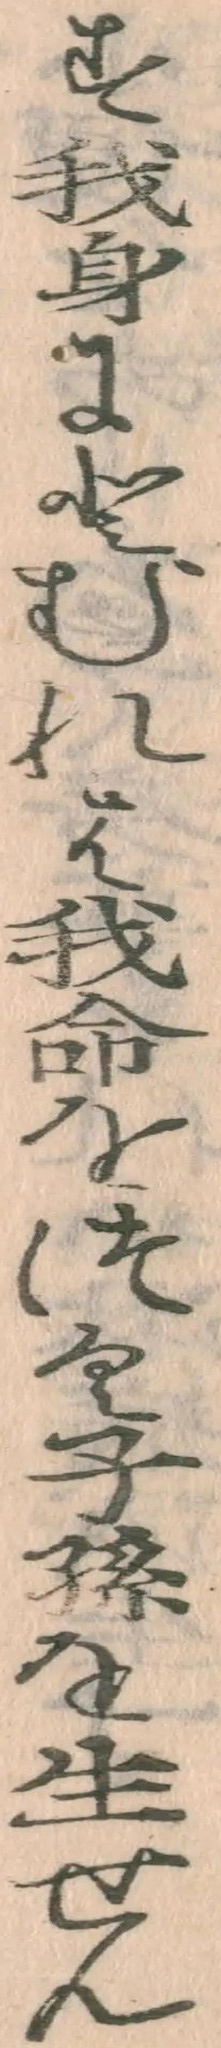す我身にとむれは我命をつく子孫を生せん
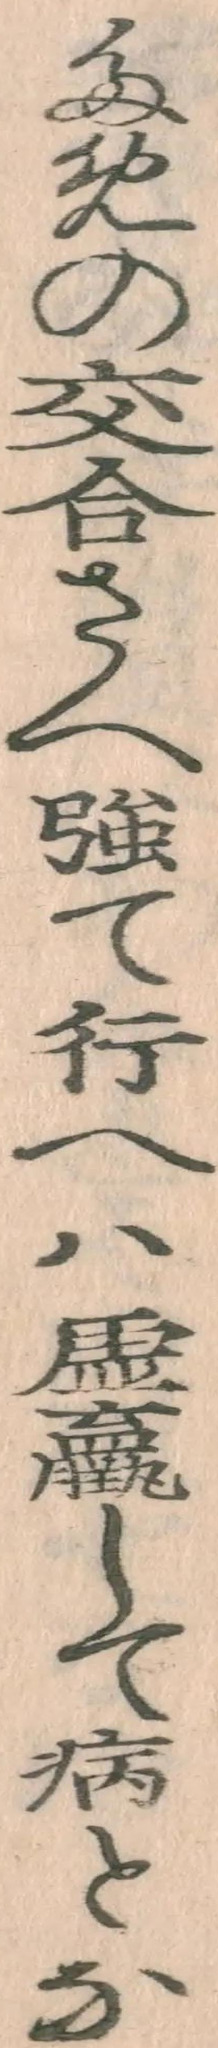ための交合さへ強て行へは虚羸して病とな
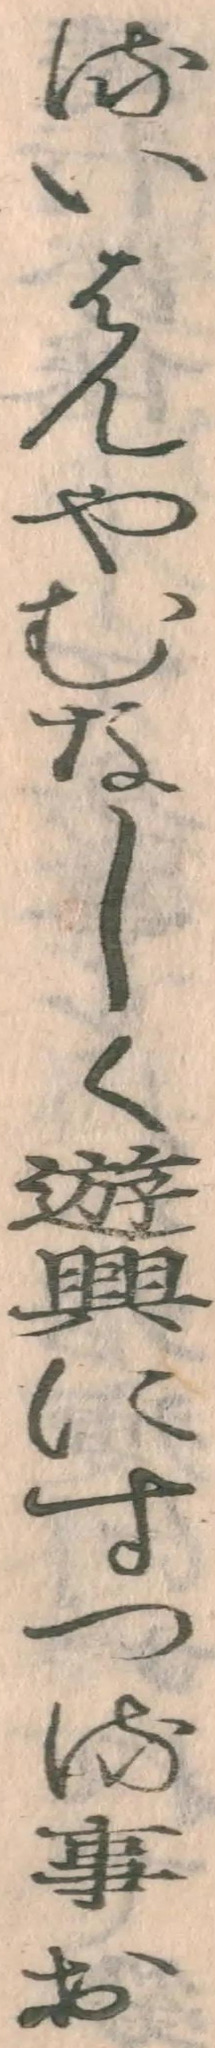るいはんやむなしく遊興にすつる事お
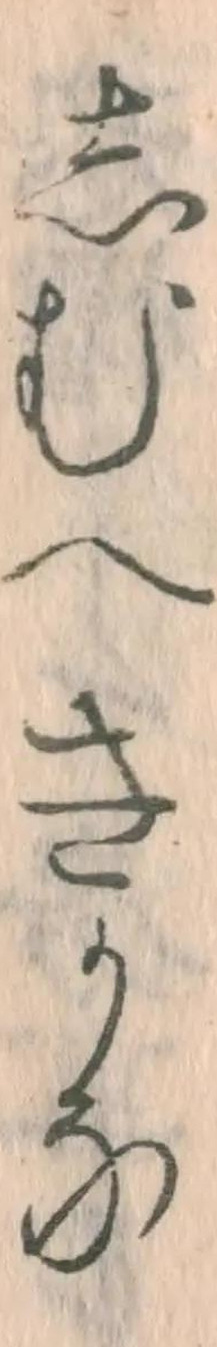しむへきかな
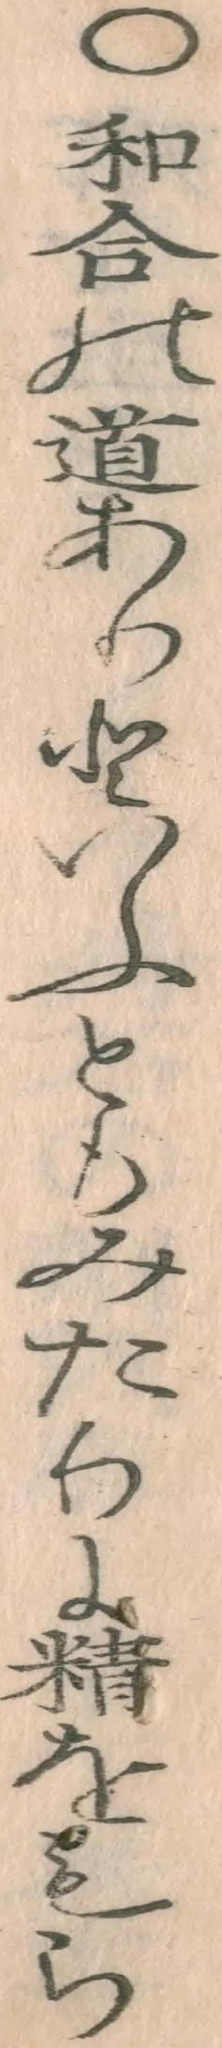〇和合の道ありといふともみたりに精をもら
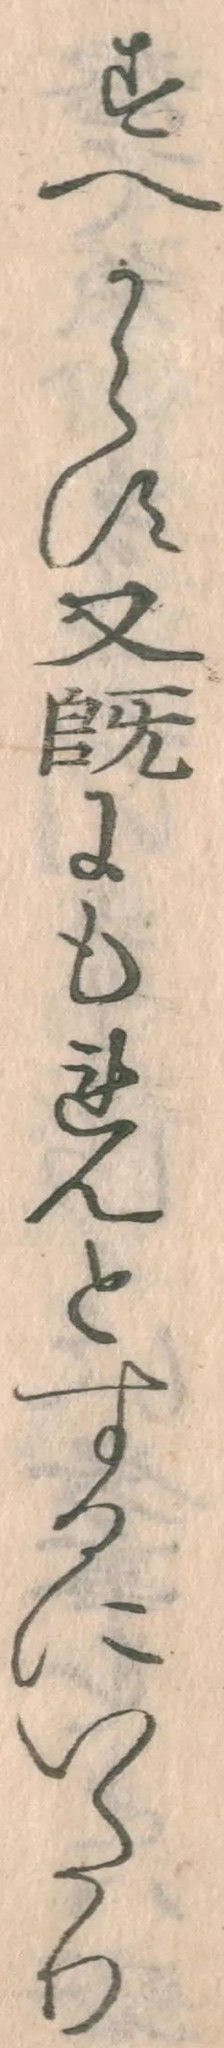すへからす又既にもれんとするにいたり
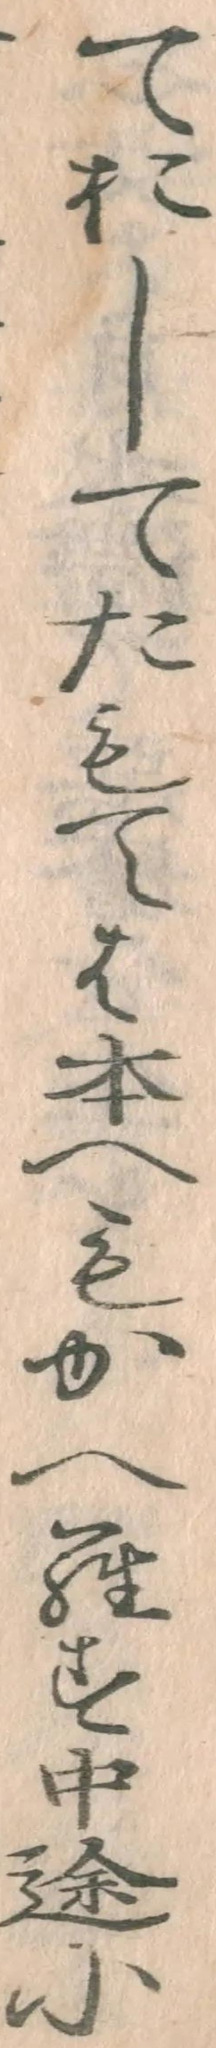ておしてたもては本へもかへらす中途に
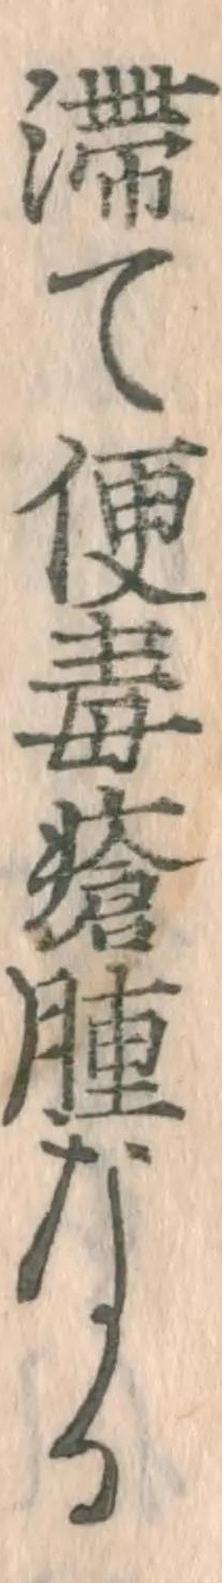滞て便毒瘡腫なる
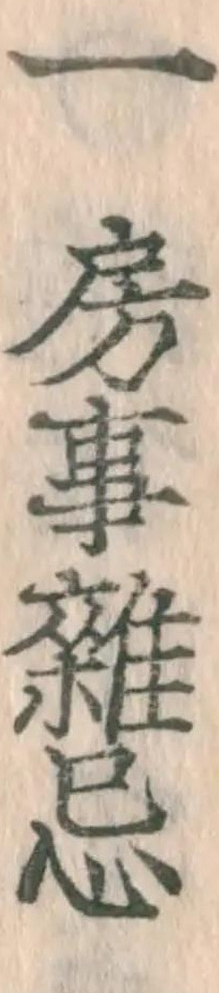一房事雑忌

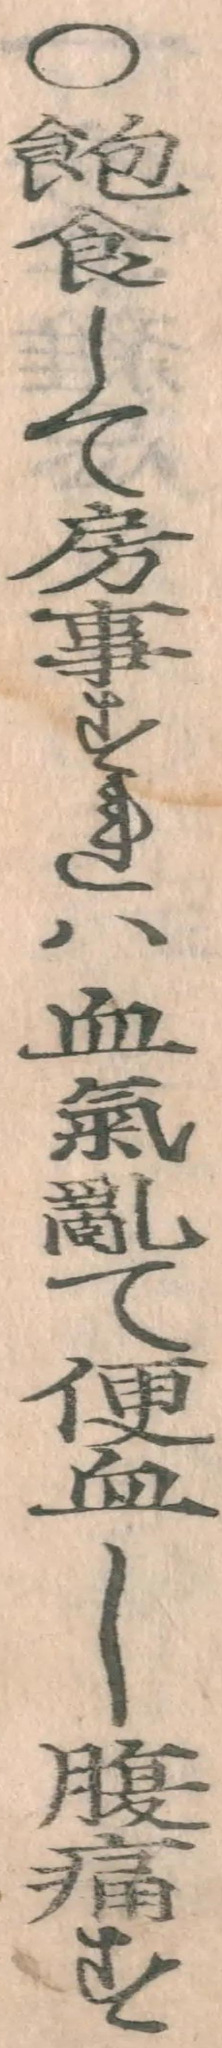〇飽食して房事すれは血気乱て便血し腹痛す
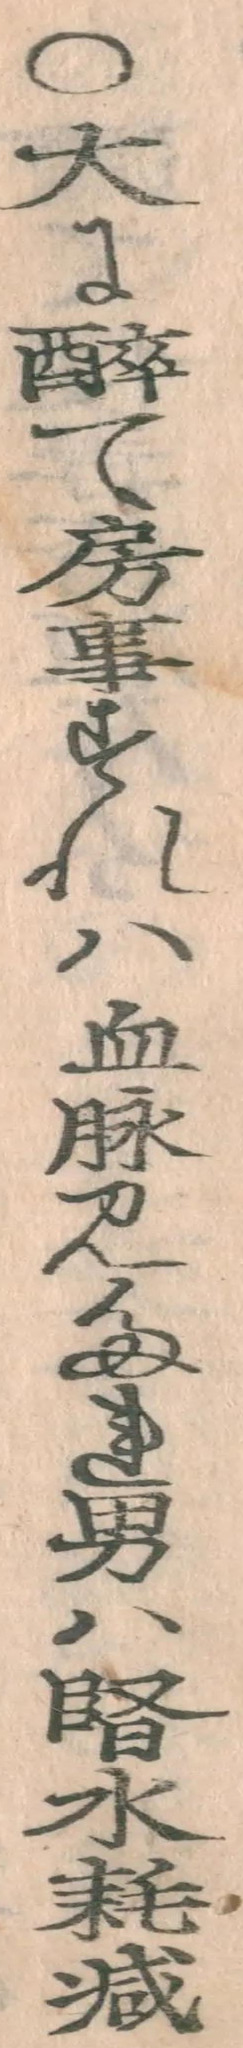〇大に酔て房事すれは血脈みたれ男は腎水耗減
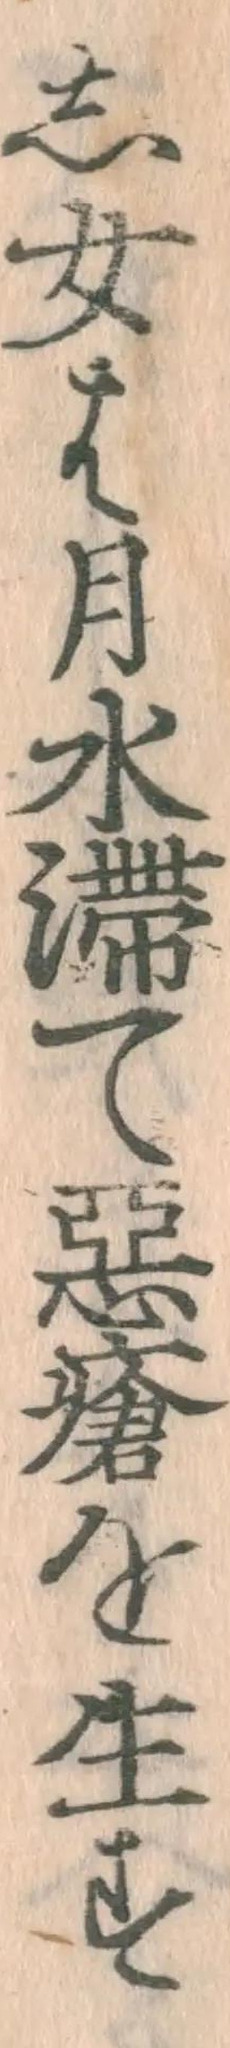し女は月水滞て悪瘡を生す
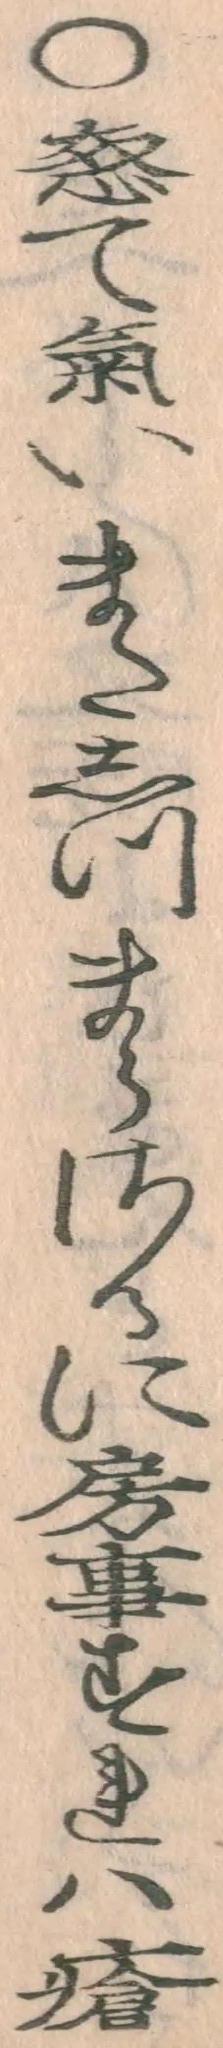〇怒て気いまたしつまらさるに房事すれは瘡
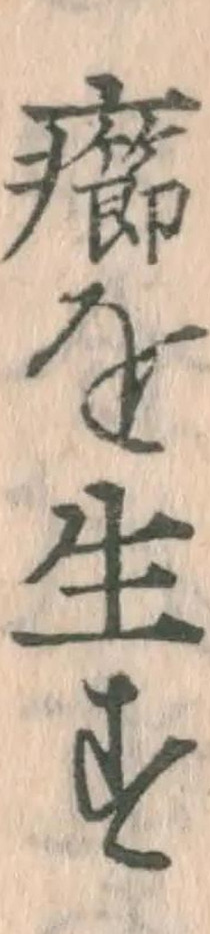癤を生す
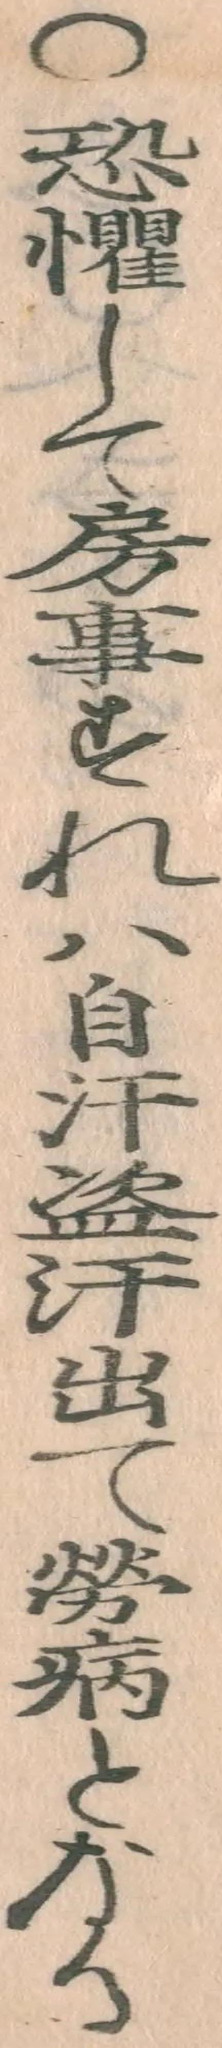〇恐懼して房事すれは自汗盗汗出て労病となる
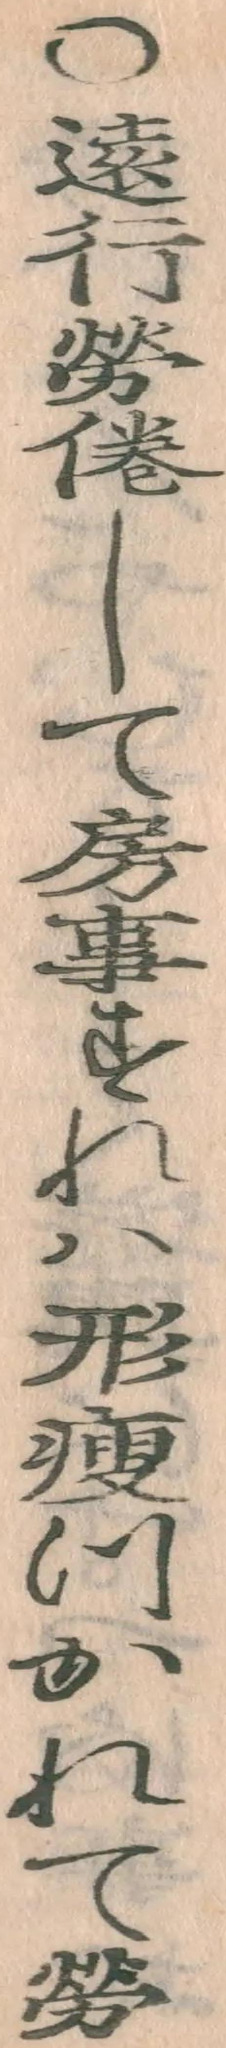〇遠行労倦して房事すれは形痩つかれて労
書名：延壽撮要
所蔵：国立国会図書館 National Diet Library, JAPAN
